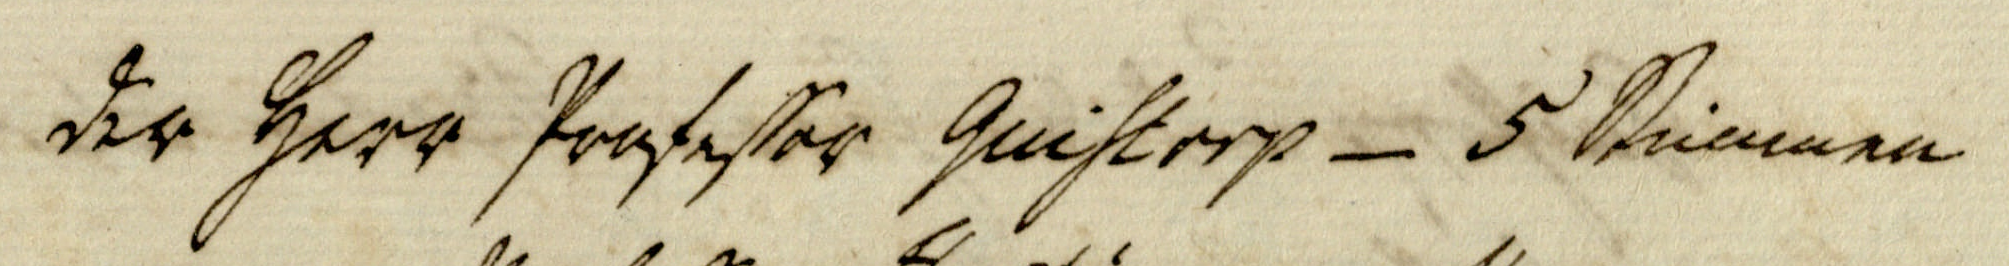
der Herr Professor Quistorp 5 Stimmen
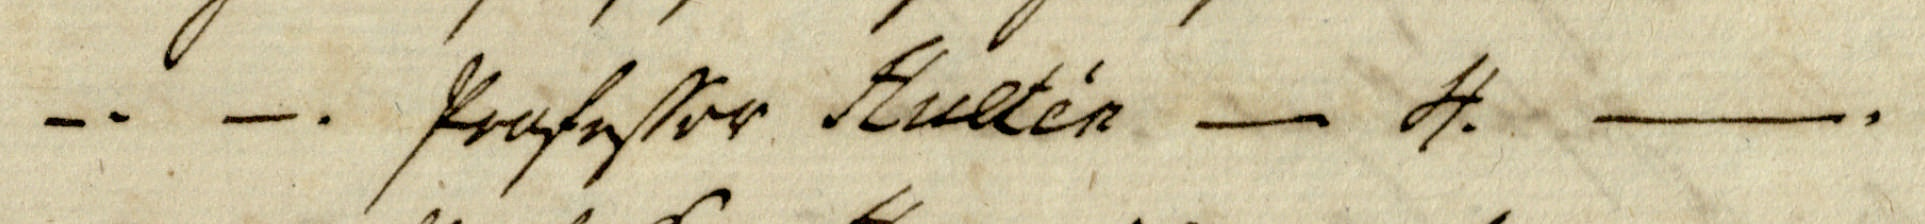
Professor Hultén 4.
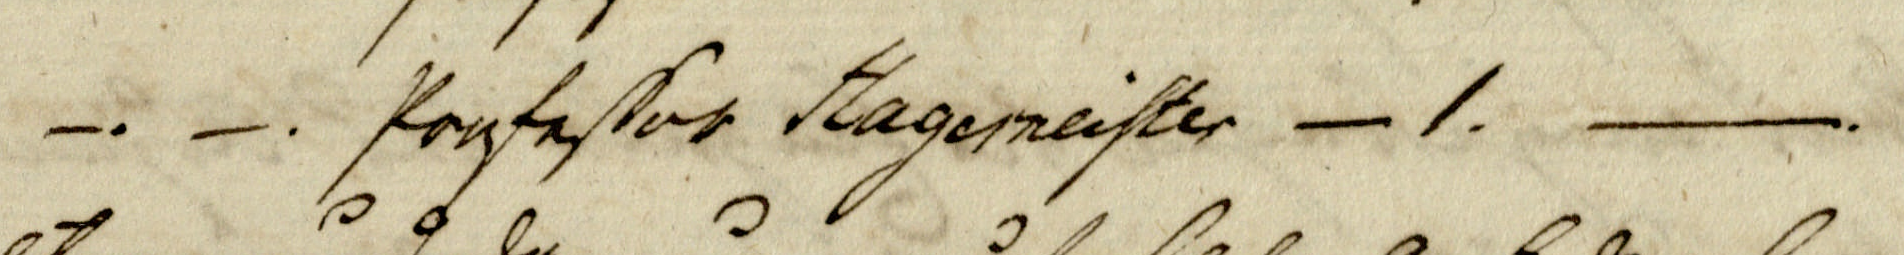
Professor Hagemeister 1.
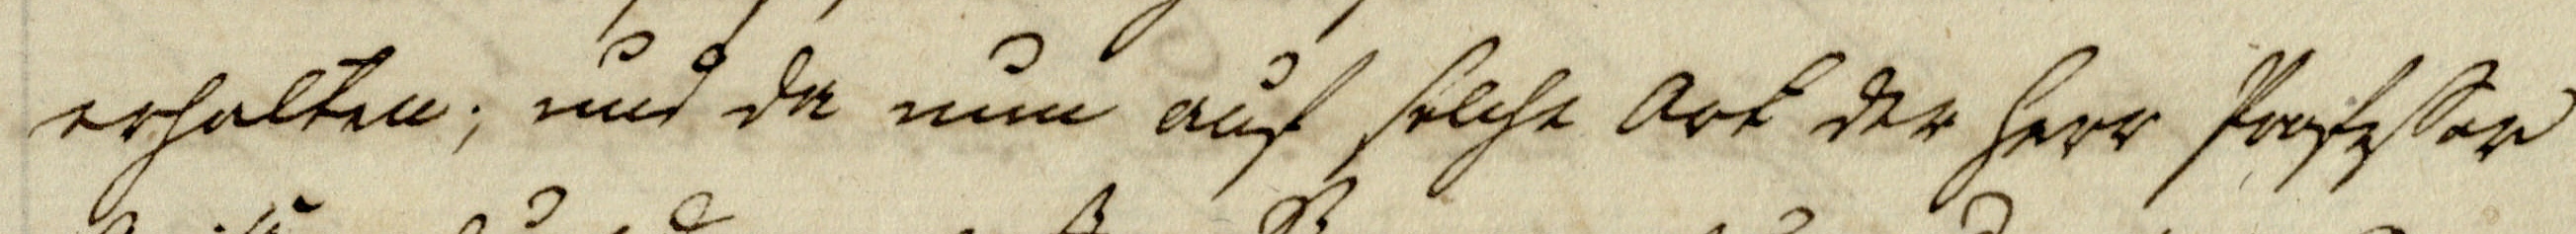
erhalten; und da nun auf solche Art der Herr Professor
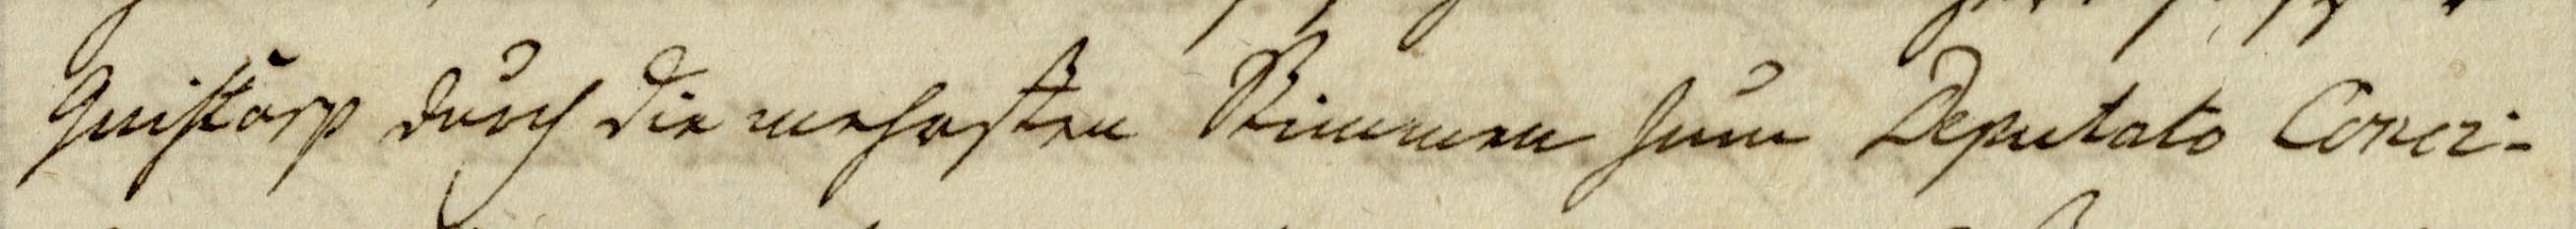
Quistorp durch die mehrsten Stimmen zum Deputato Conci¬
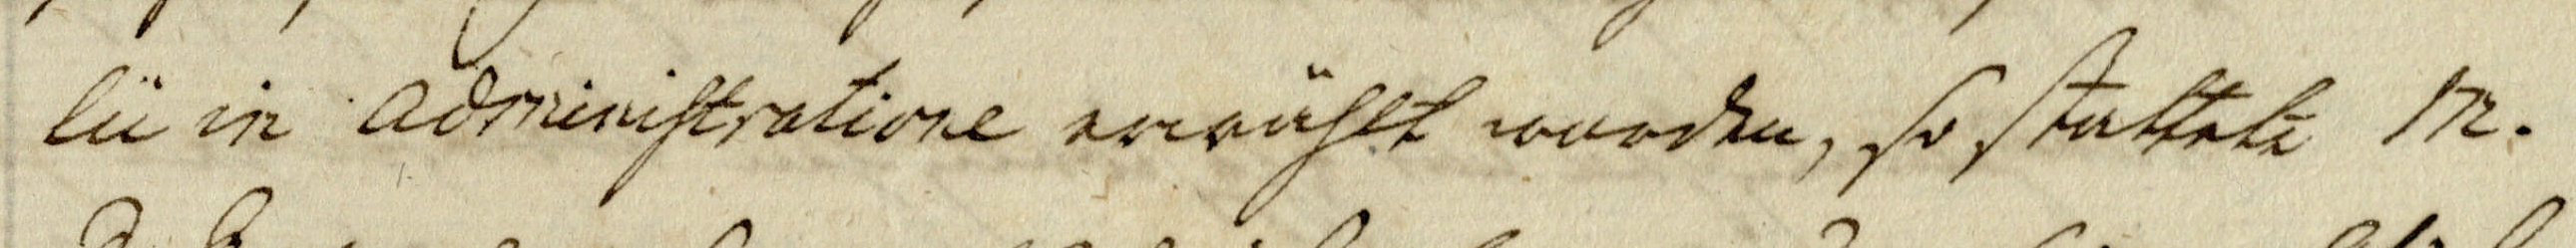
lii in Administratione erwählt worden, so stattete M.
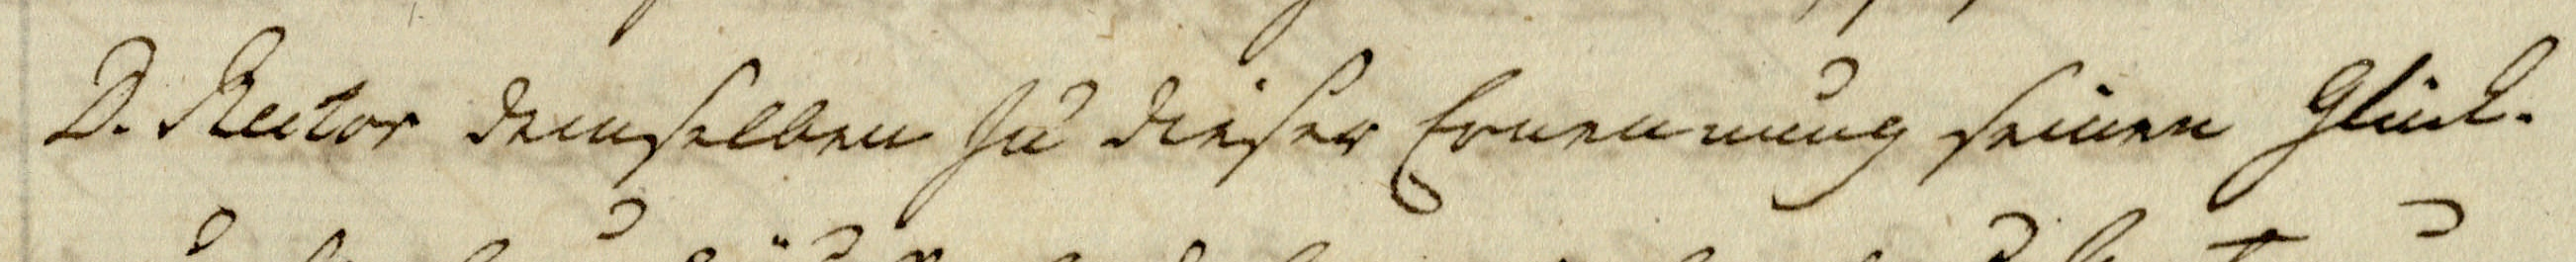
D. Rector demselben zu dieser Ernennung seinen Glück¬
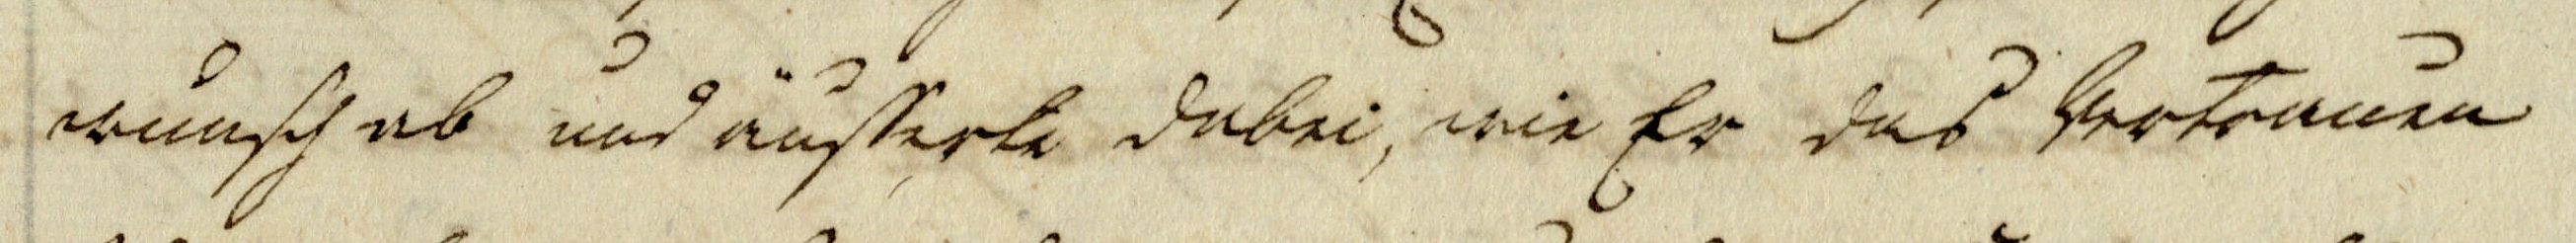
wunsch ab und äusserte dabei, wie Er das Vertrauen
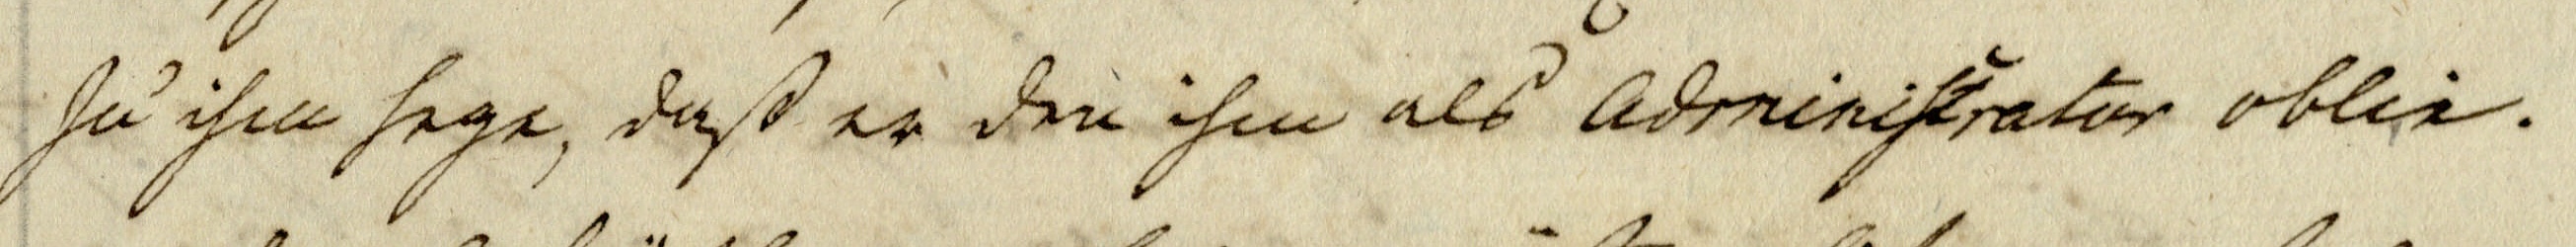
zu ihm hege, daß er den ihm als Administrator oblie¬
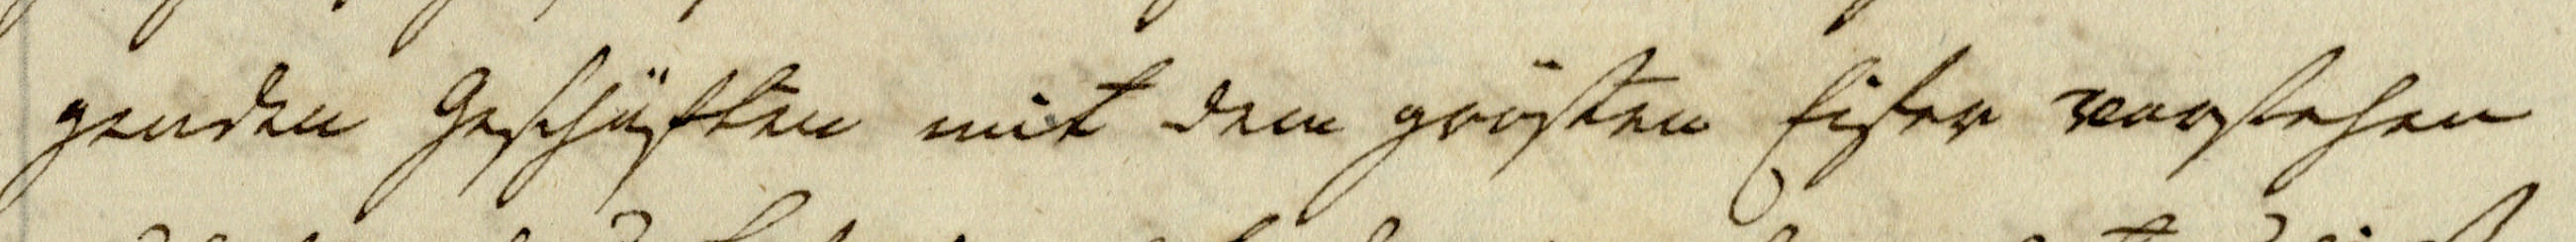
genden Geschäften mit dem grösten Eifer versehen
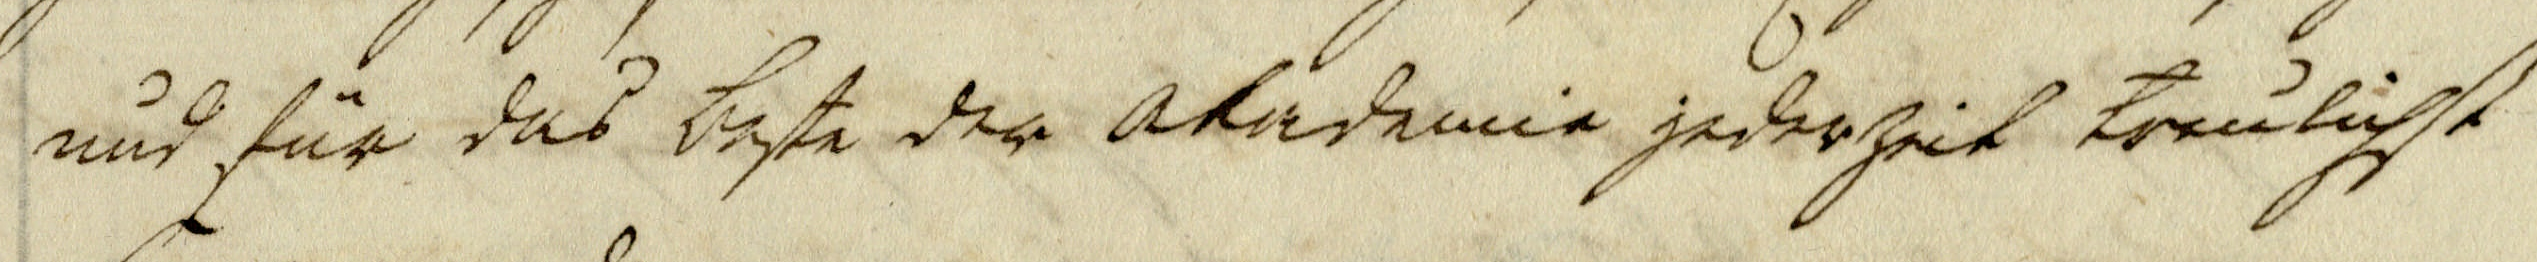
und für das Beste der Akademie jederzeit treulichst
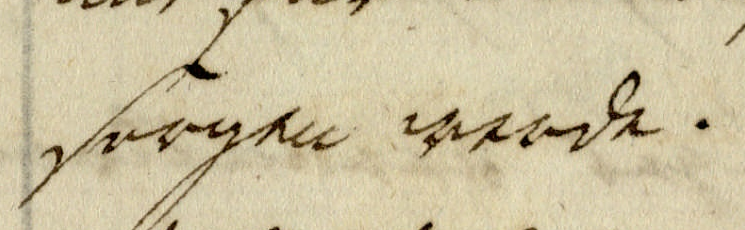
sorgen werde.
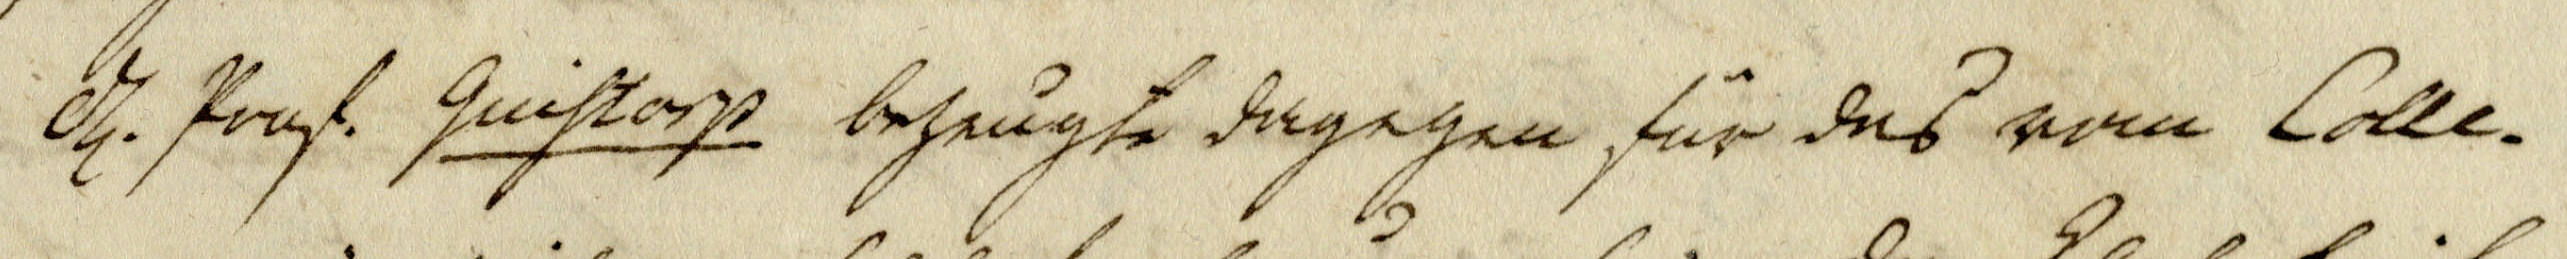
dh. Prof. Quistorp bezeugte dagegen für das vom Colle¬
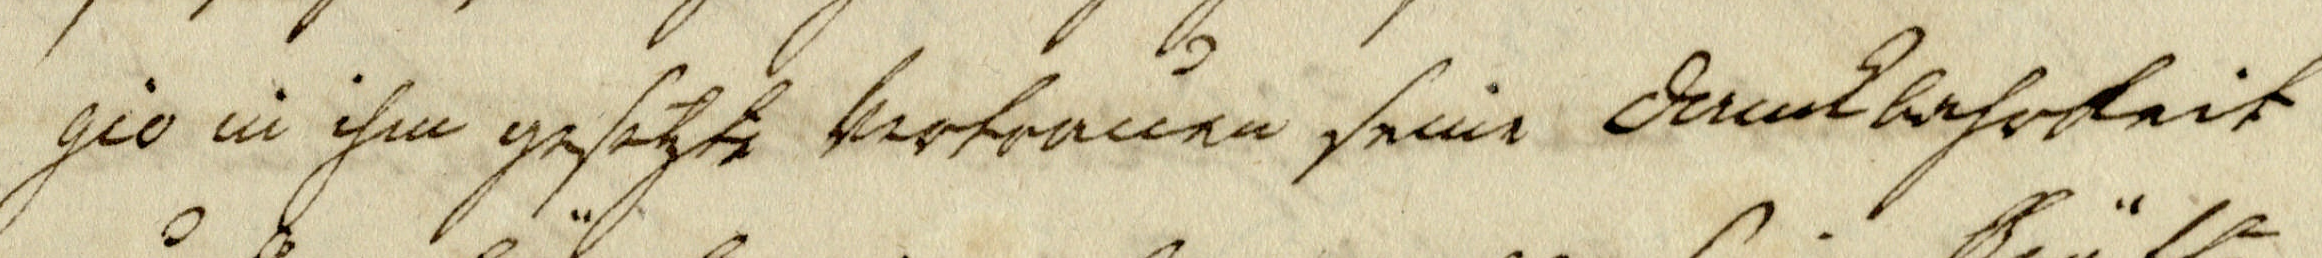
gio in ihm gesetzte Vertrauen seine Danckbahrkeit
